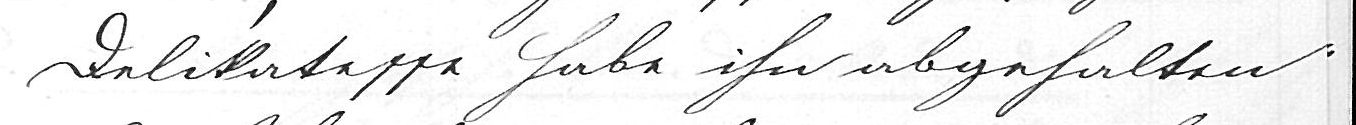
Delikatesse habe ihn abgehaltenen
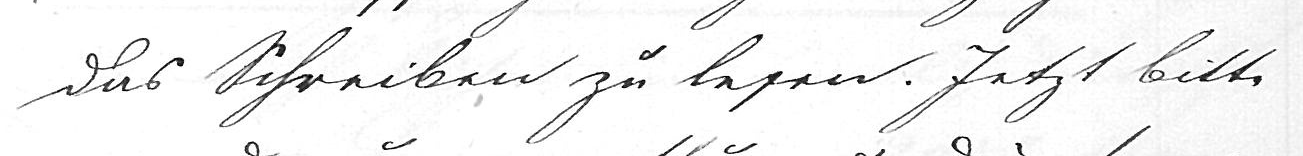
das Schreiben zu lesen. Jetzt bitte
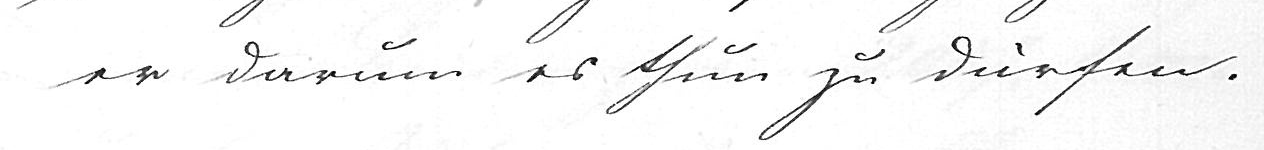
er darum es thun zu dürfen.
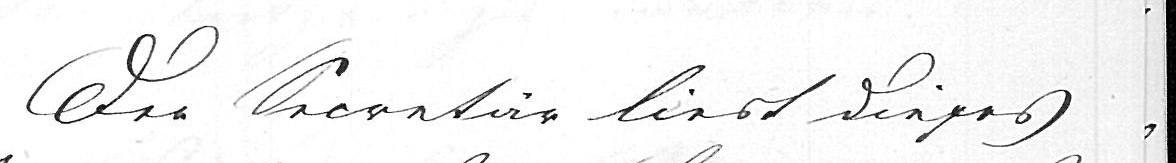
Der Secretär liest dieses
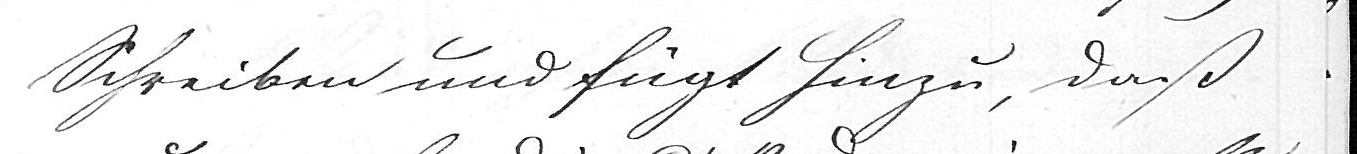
Schreiben und fügt hinzu, daß
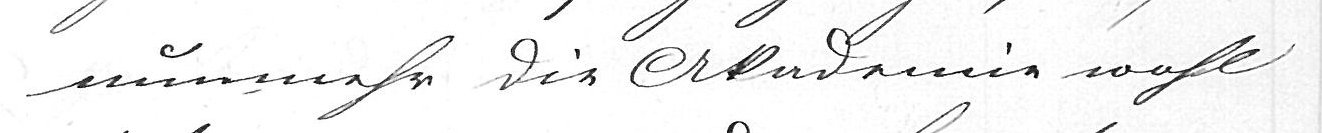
nunmehr die Akademie wohl
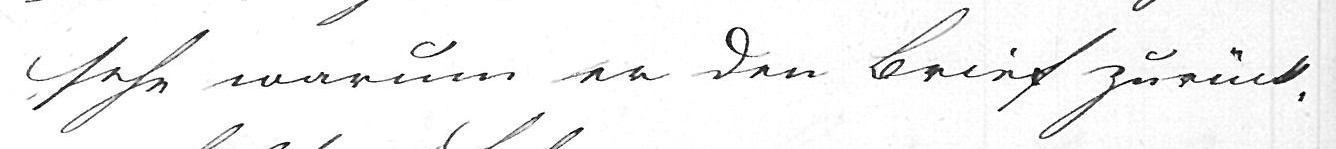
sehe warum er den Brief zurück-
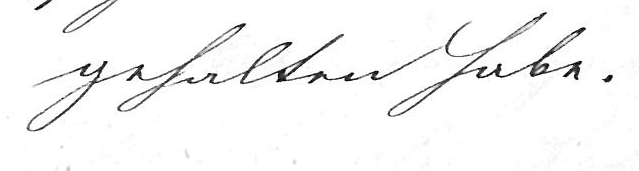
gehalten habe.
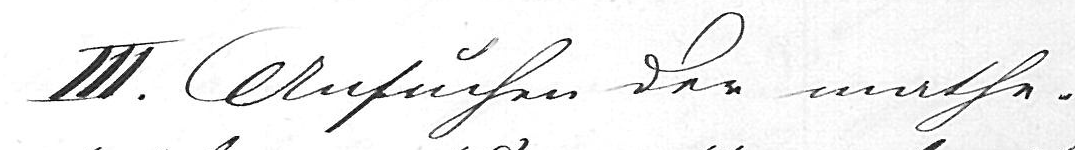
III. Ansuchen der mathe-
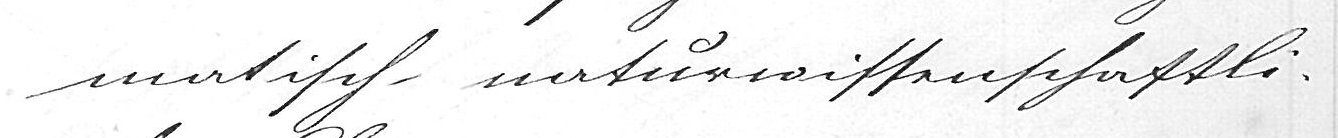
matisch-naturwissenschaftli-
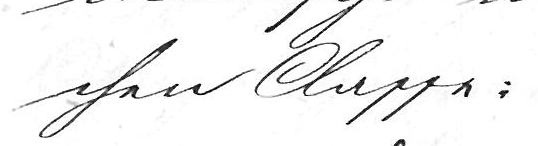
chen Classe:
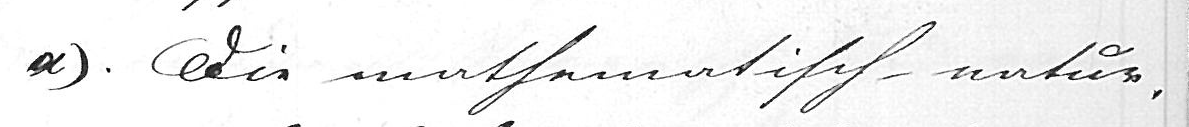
a) Die mathematisch-natur-
